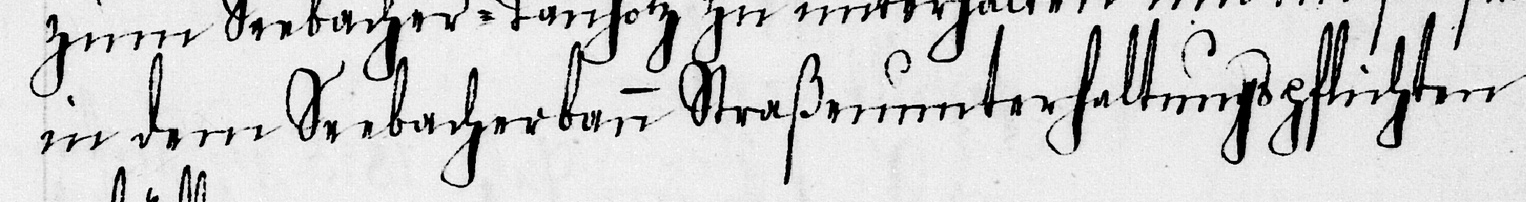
in dem Seebacherbann Straßenunterhaltungspflichten
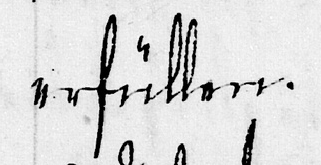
erfüllen.
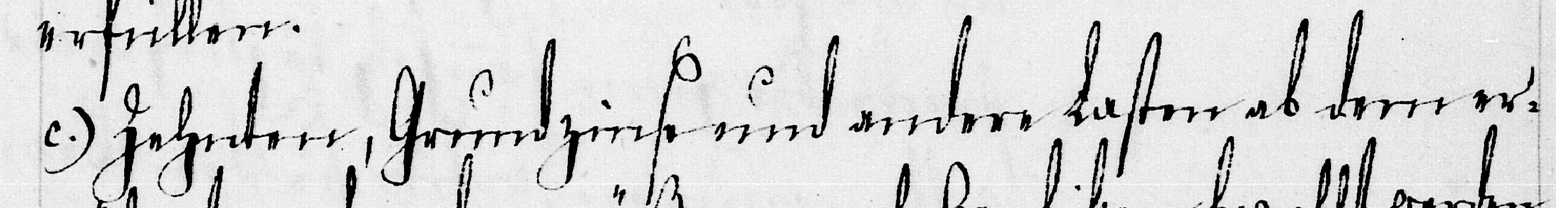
c.) Zehnten, Grundzinse und andere Lasten ab dem er¬
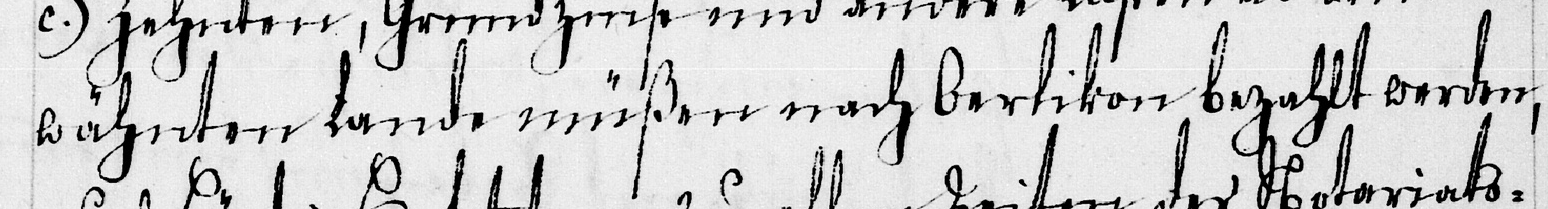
wähnten Lande müßen nach Oerlikon bezahlt werden,
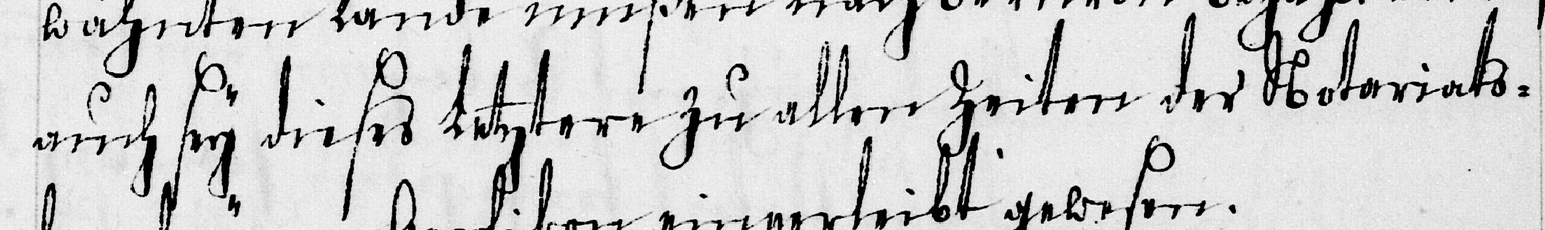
auch sey dieses Letztere zu allen Zeiten der Notariats¬
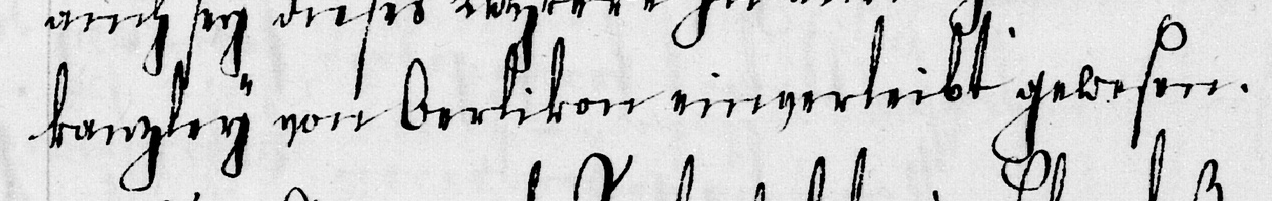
kanzley von Oerlikon einverleibt gewesen.
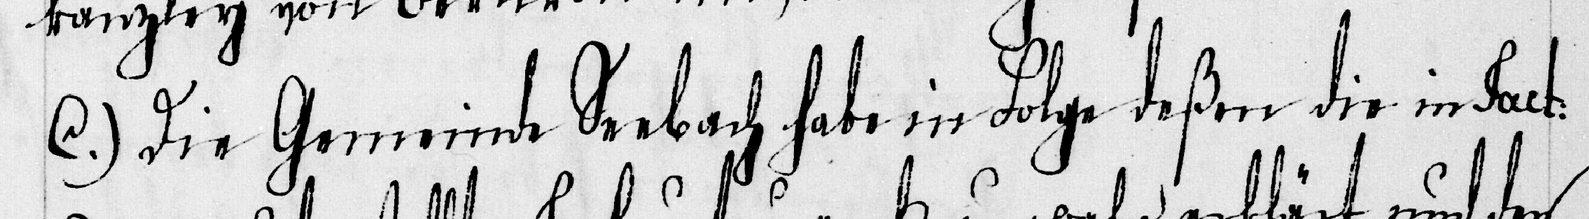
C.) Die Gemeinde Seebach habe in Folge deßen die in Fact:
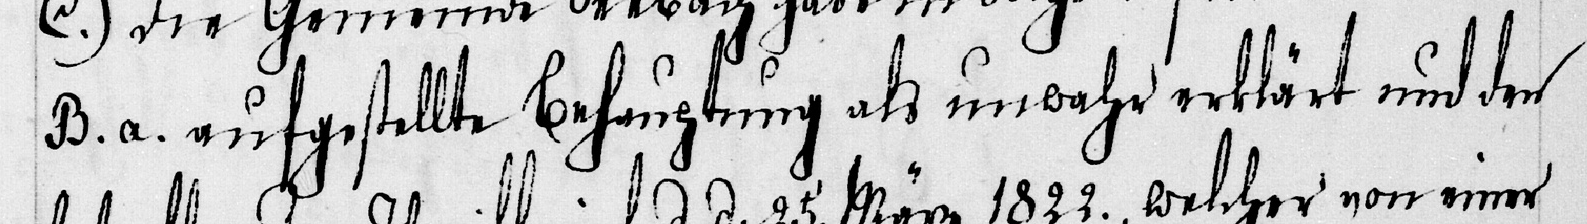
B. a. aufgestellte Behauptung als unwahr erklärt und den
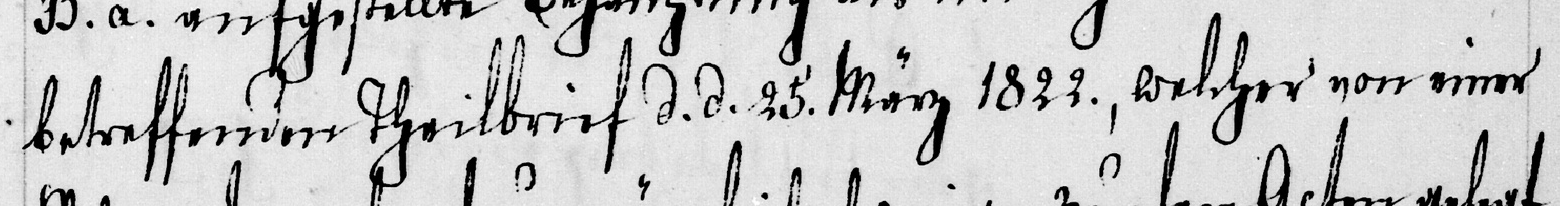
betreffenden Theilbrief d. d. 25. März 1822., welcher von einer
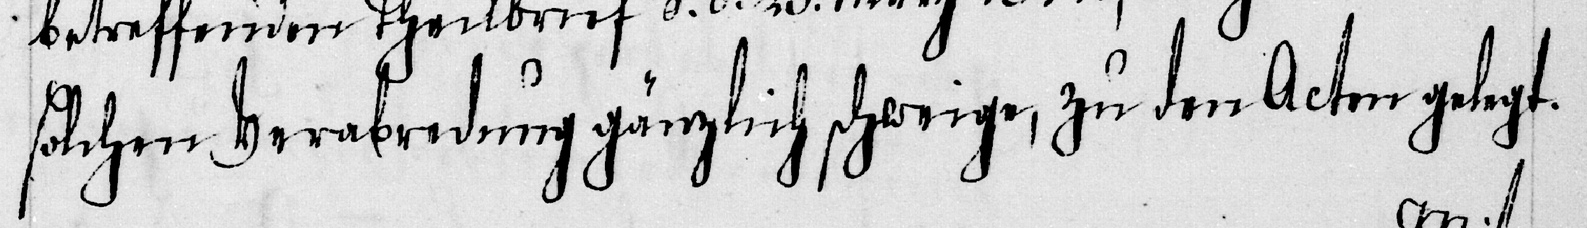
solchen Verabredung gänzlich schweige, zu den Acten gelegt.
